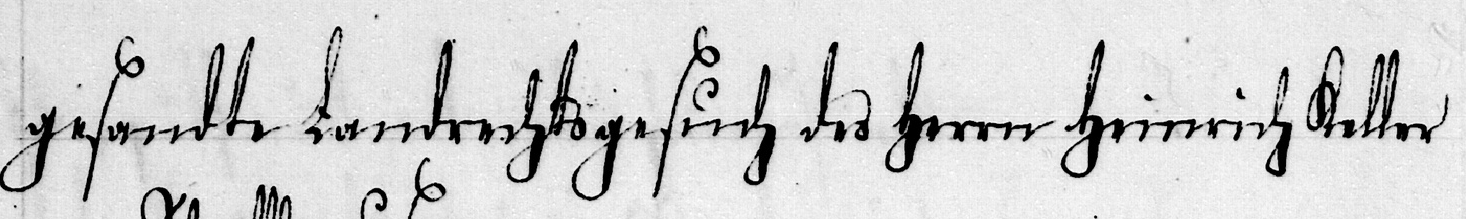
gesandte Landrechtsgesuch des Herrn Heinrich Kel¬
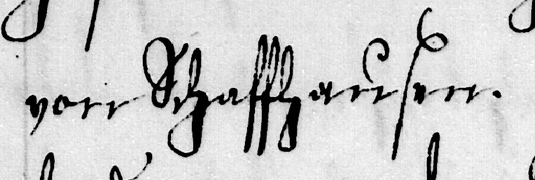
von Schaffhausen.
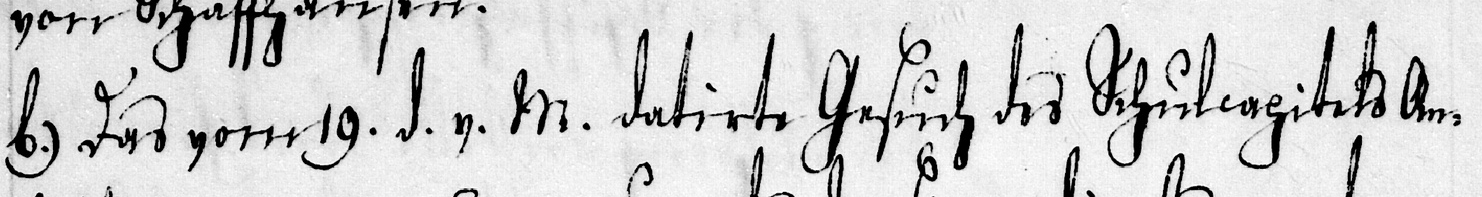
b.) Das vom 19. d. M. datirte Gesuch des Schulcapitels An¬
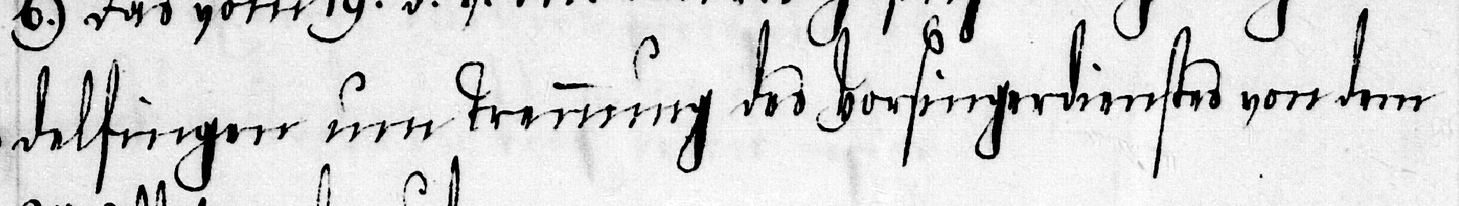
delfingen um Trennung des Vorsingerdienstes von dem
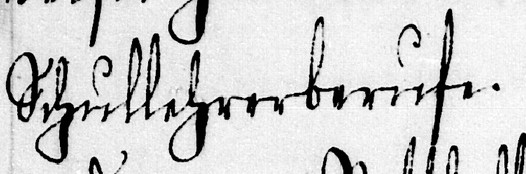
Schullehrerberufe.
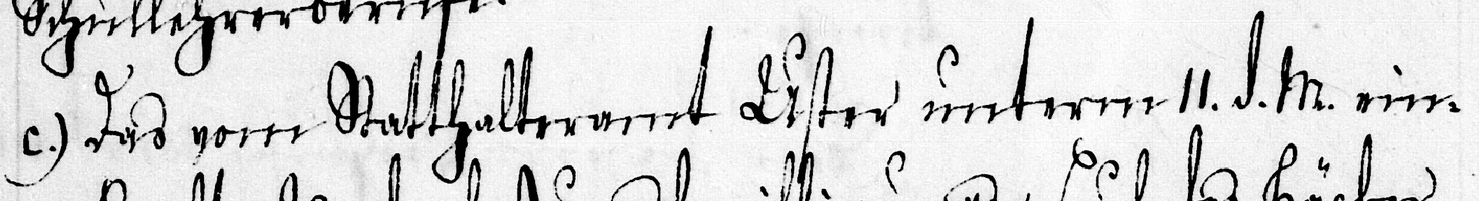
c.) Das vom Statthalteramt Uster unterm 11. d. M. ein¬
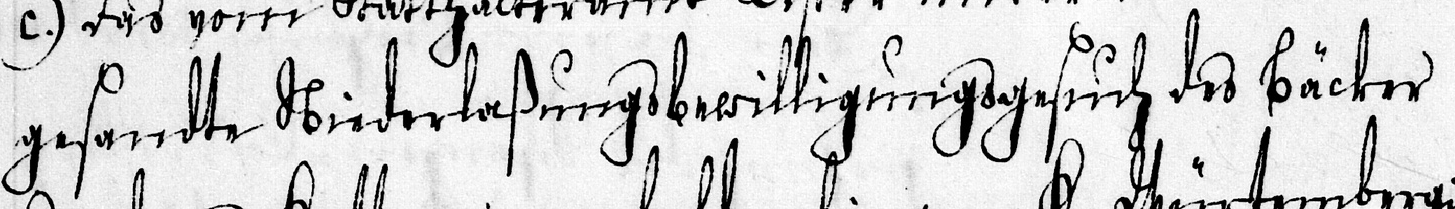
gesandte Niederlaßungsbewilligungsgesuch des Bäcker
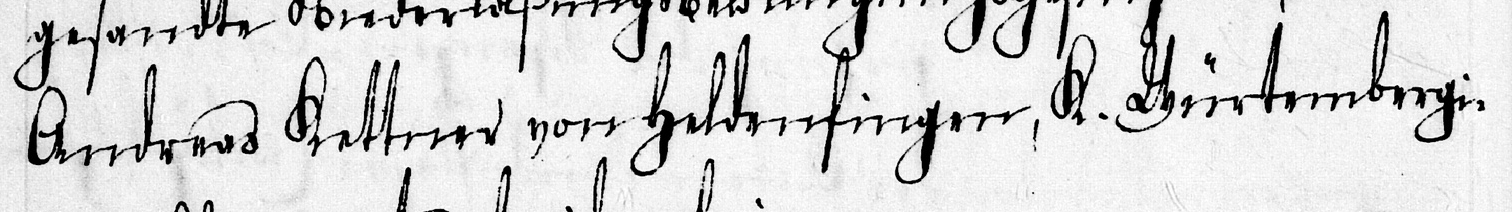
Andreas Kettner von Heldenfingen, K. Würtembergi¬
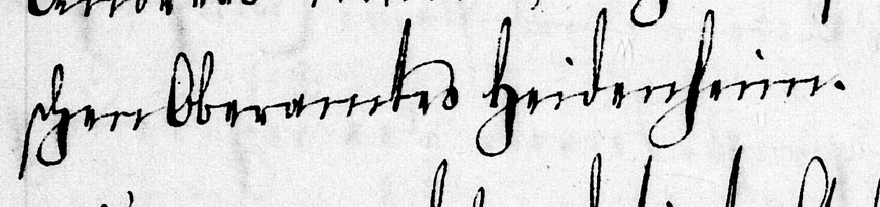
schen Oberamtes Heidenheim.
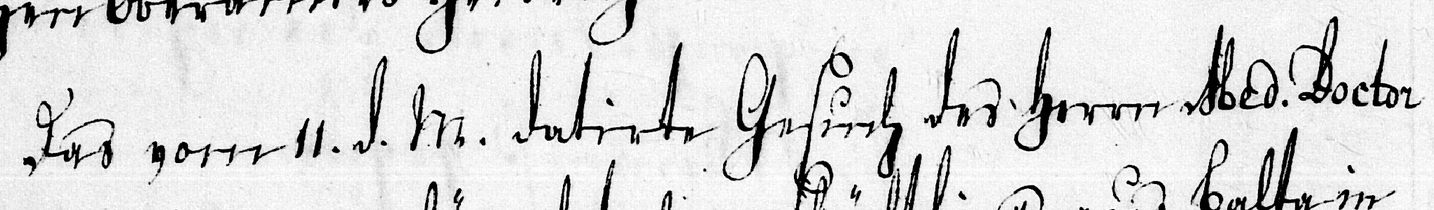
Das vom 11. d. M. datirte Gesuch des Herrn Med. Doctor
